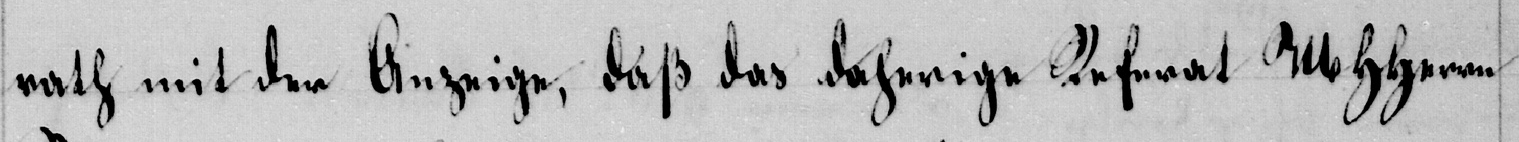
rath mit der Anzeige, dass das daherige Referat MHHerrn
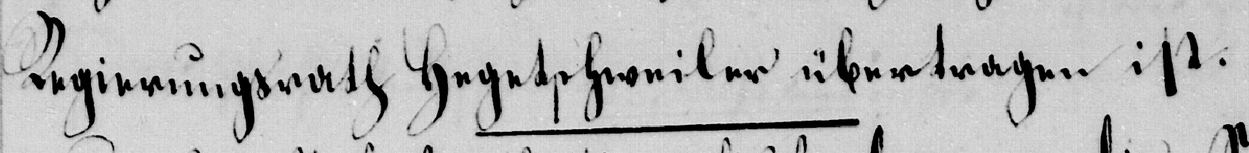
Regierungsrath Hegetschweiler übertragen ist.
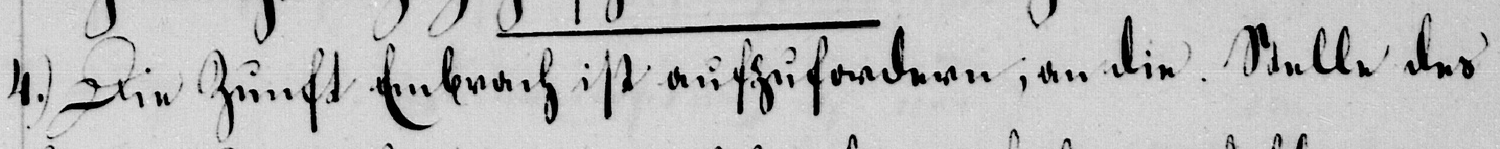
4.) Die Zunft Embrach ist aufzufordern, an die Stelle des
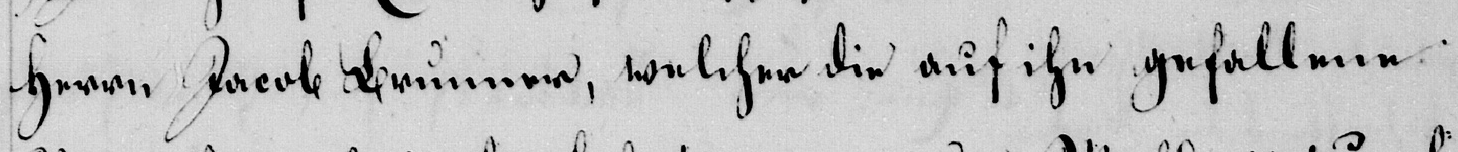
Herrn Jacob Brunner, welcher die auf ihn gefallene
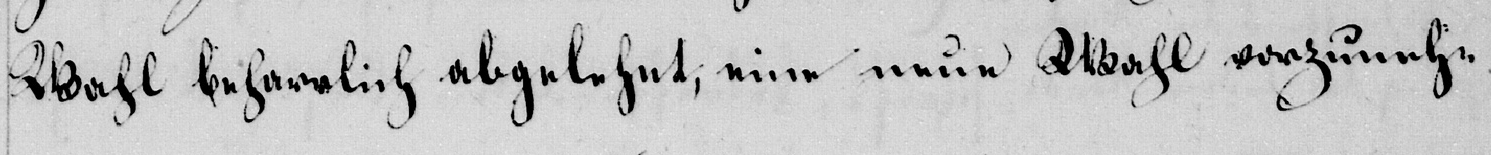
Wahl beharrlich abgelehnt, eine neue Wahl vorzuneh¬
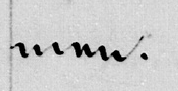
men.
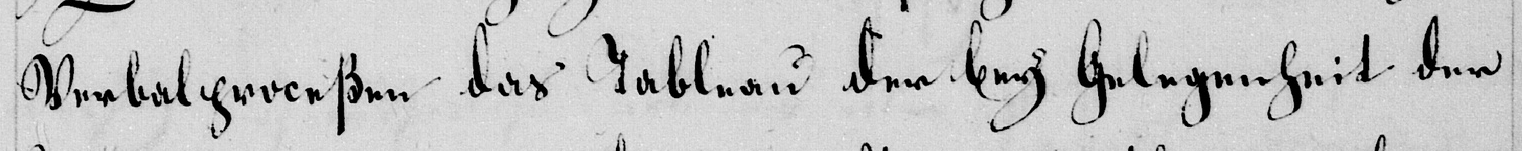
Verbalproceßen das Tableau der bey Gelegenheit der
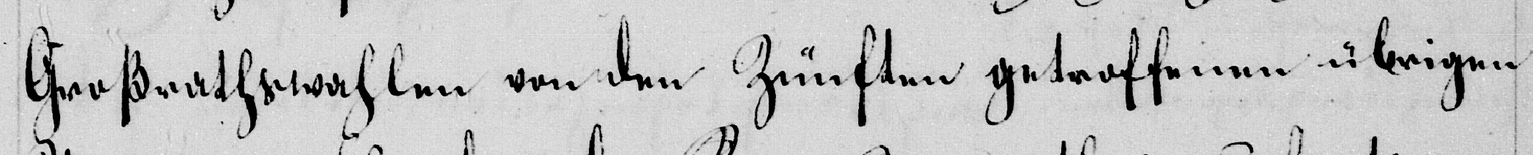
Großrathswahlen von den Zünften getroffenen übrigen
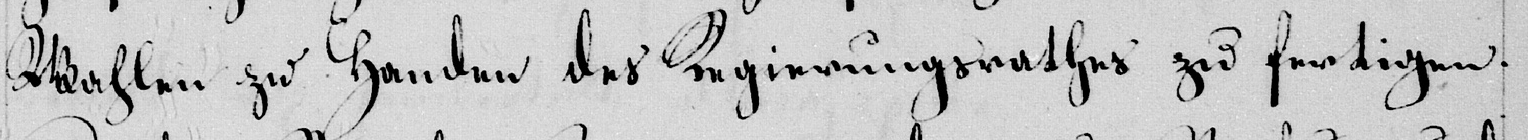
Wahlen zu Handen des Regierungsrathes zu fertigen.
